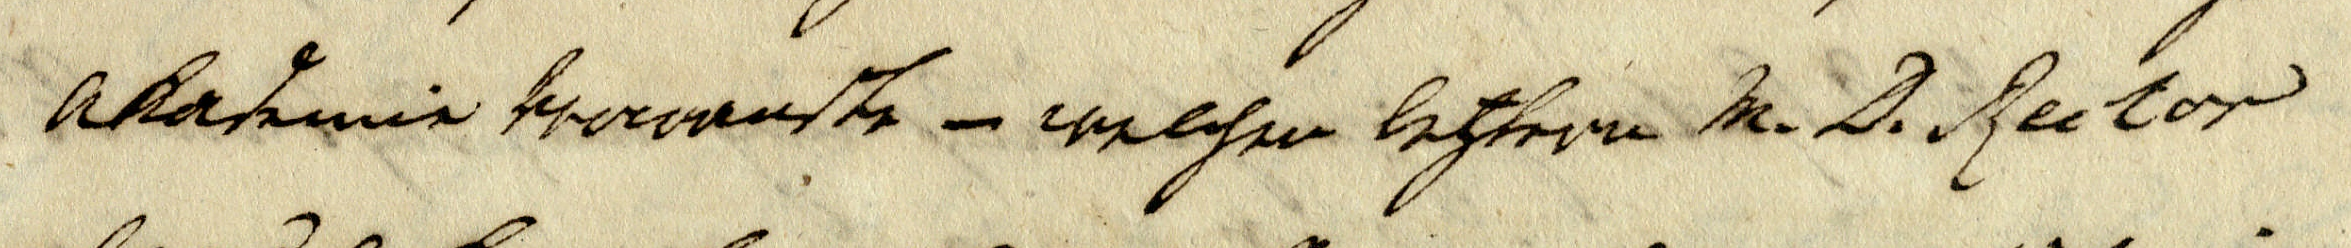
Akademie Verwandte - welchen letztern M. D. Rector
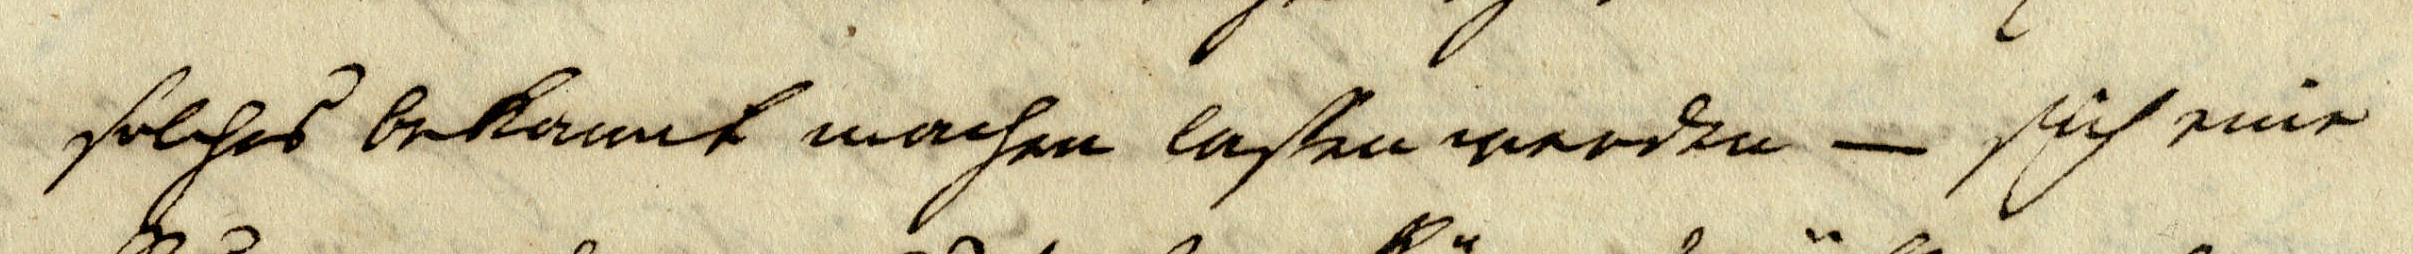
solches bekannt machen lassen werden - sich eine
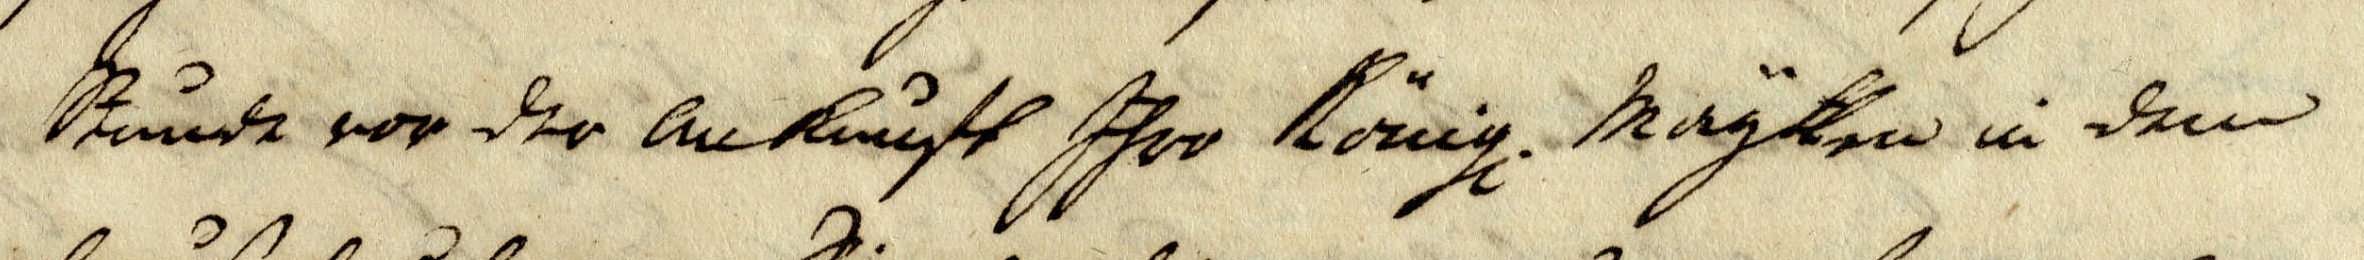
Stunde vor der Ankunft Ihro Königl. Maÿtten in dem
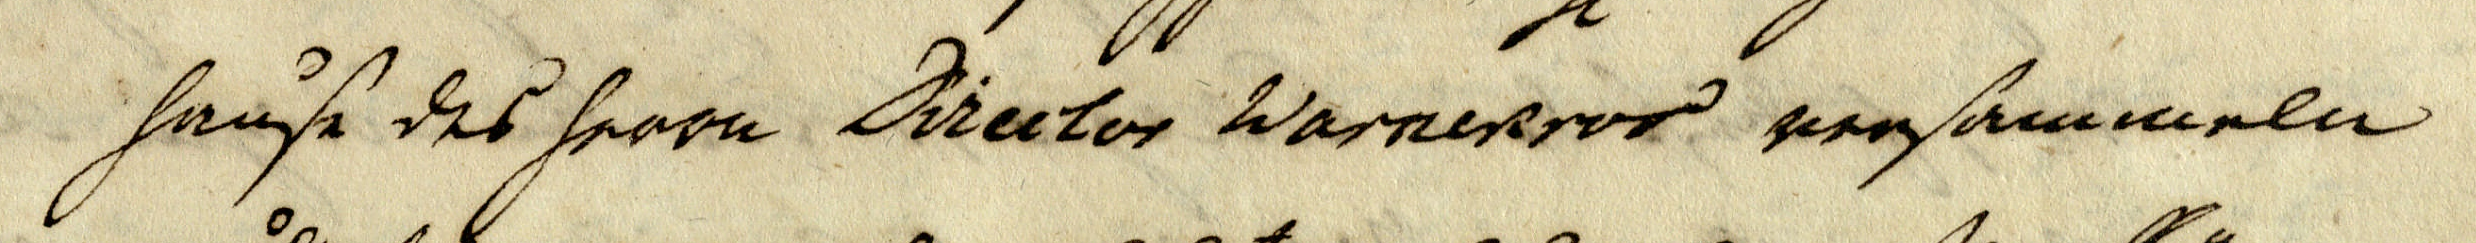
Hause des Herrn Director Warnekros versammeln
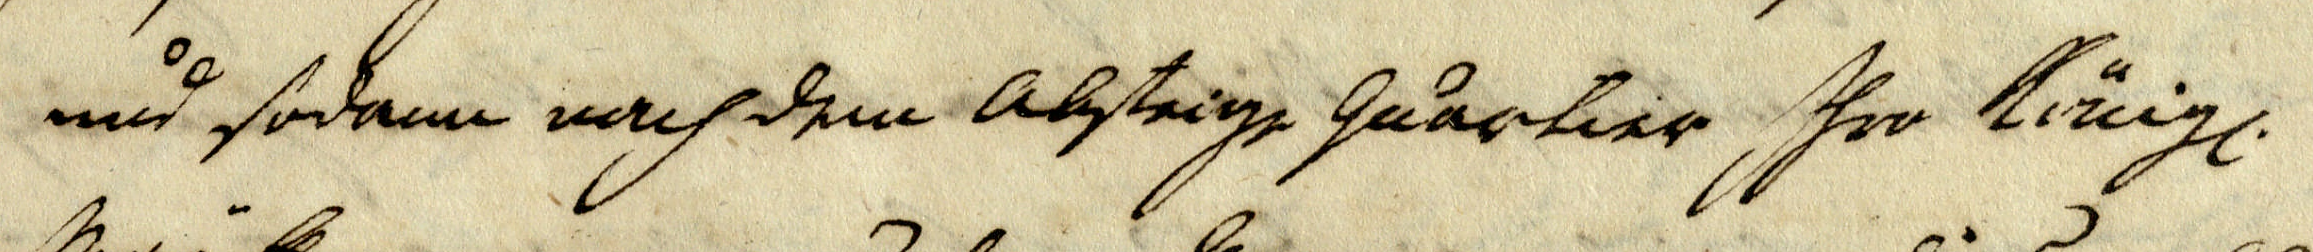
und sodann nach dem Absteige Quartier Ihro Königl.
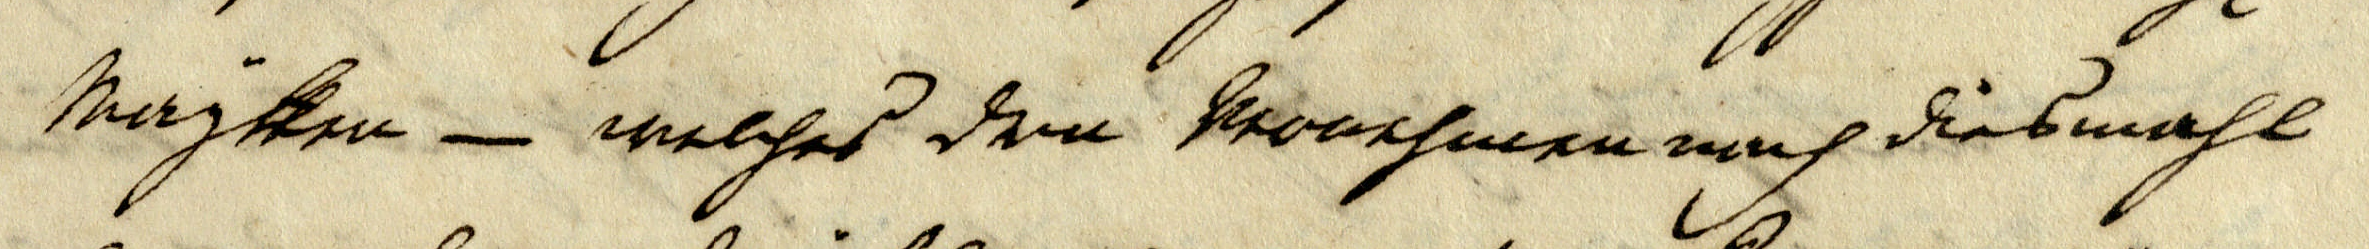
Maÿtten - welches dem Vernehmen nach diesmahl
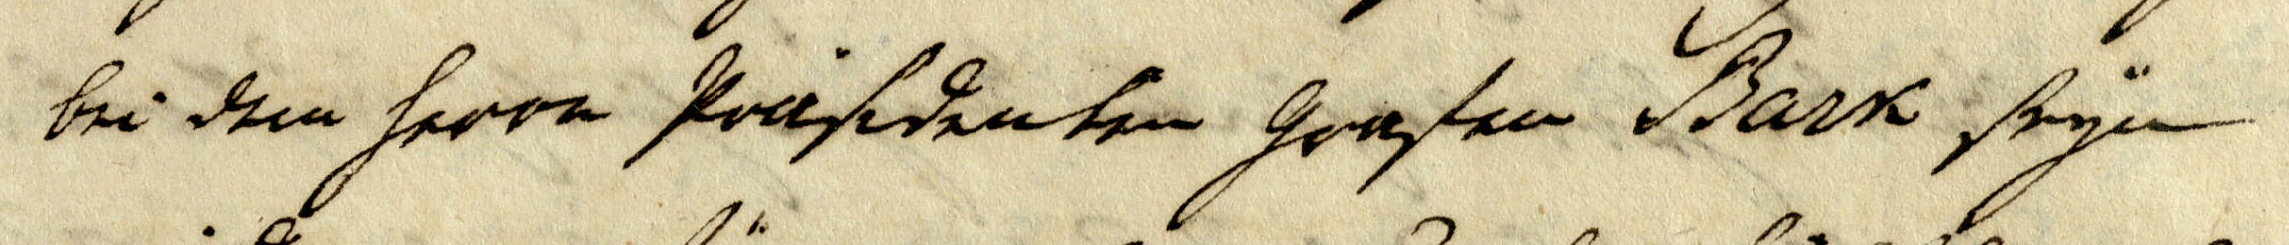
bei dem Herrn Präsidenten Grafen Bark seÿn
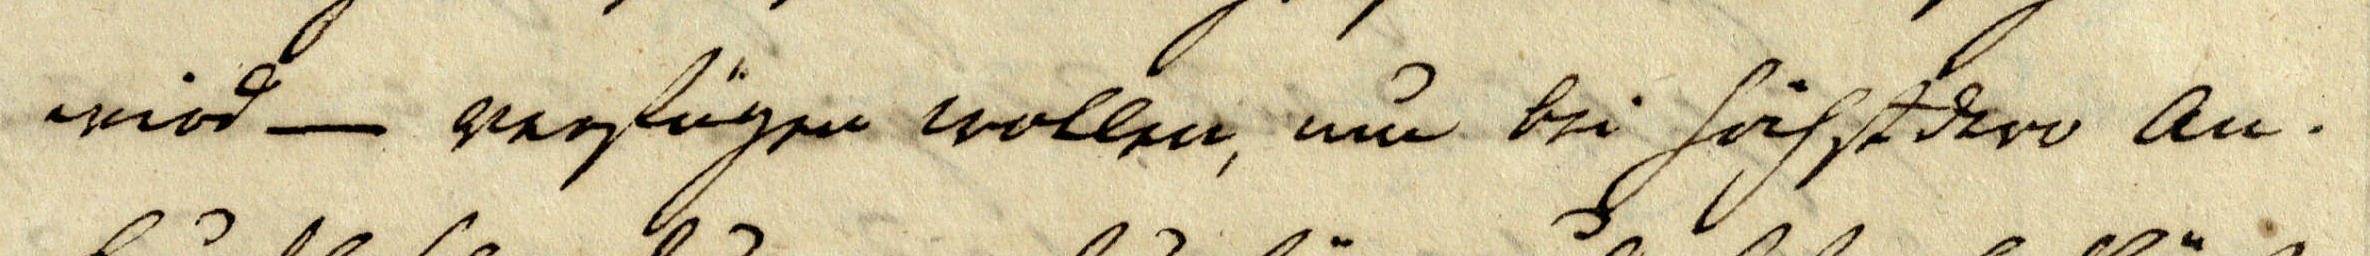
wird - verfügen wollen, um bei höchstdero An¬
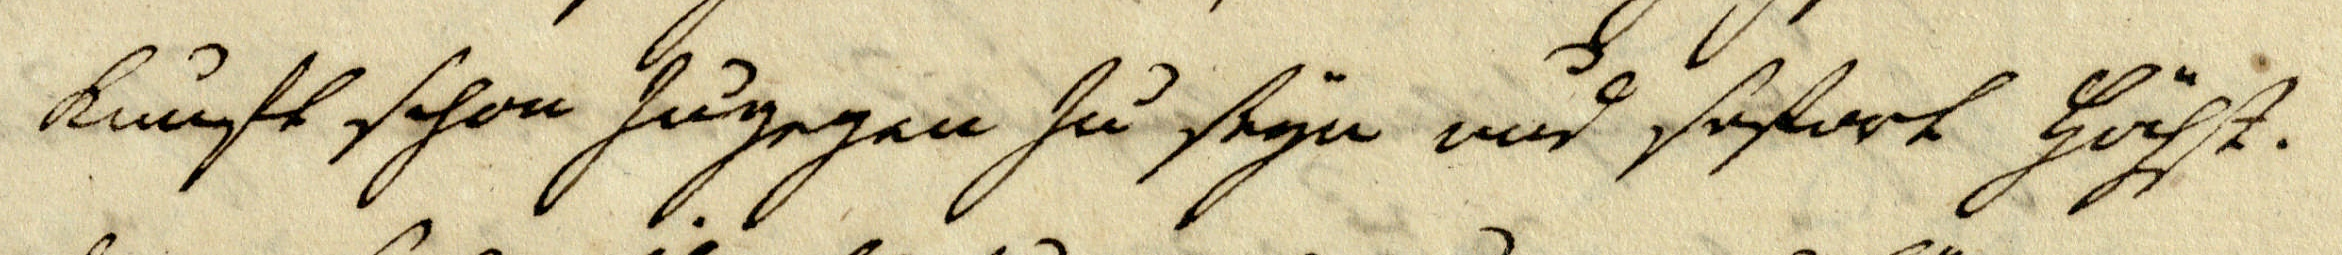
kunft schon zugegen zu seÿn und sofort Höchst¬
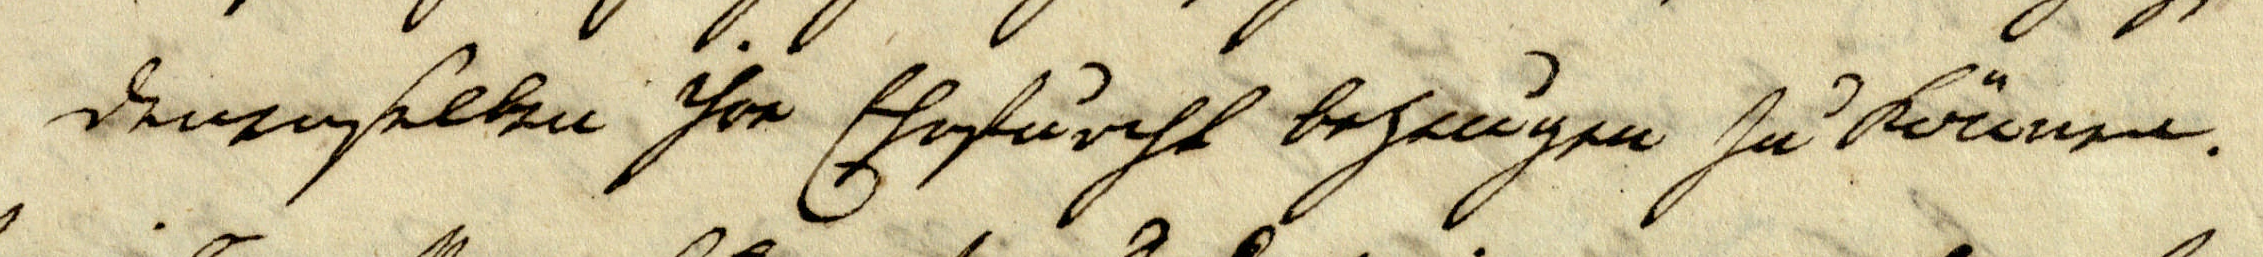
denenselben ihre Ehrfurcht bezeugen zu können.
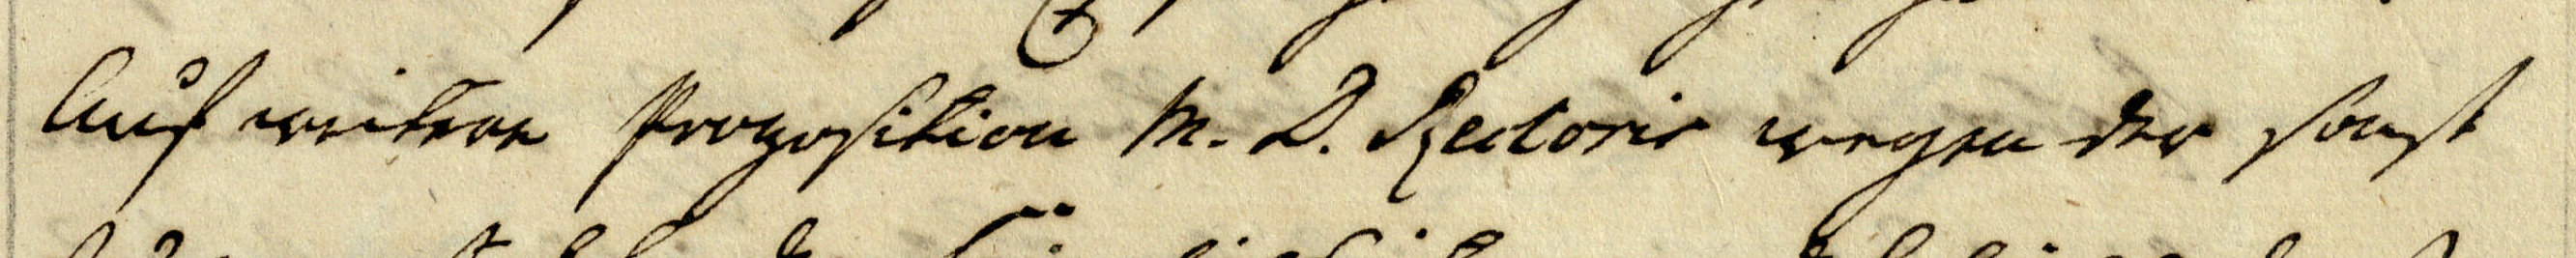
Auf weitere Proposition M. D. Rectoris wegen der sonst
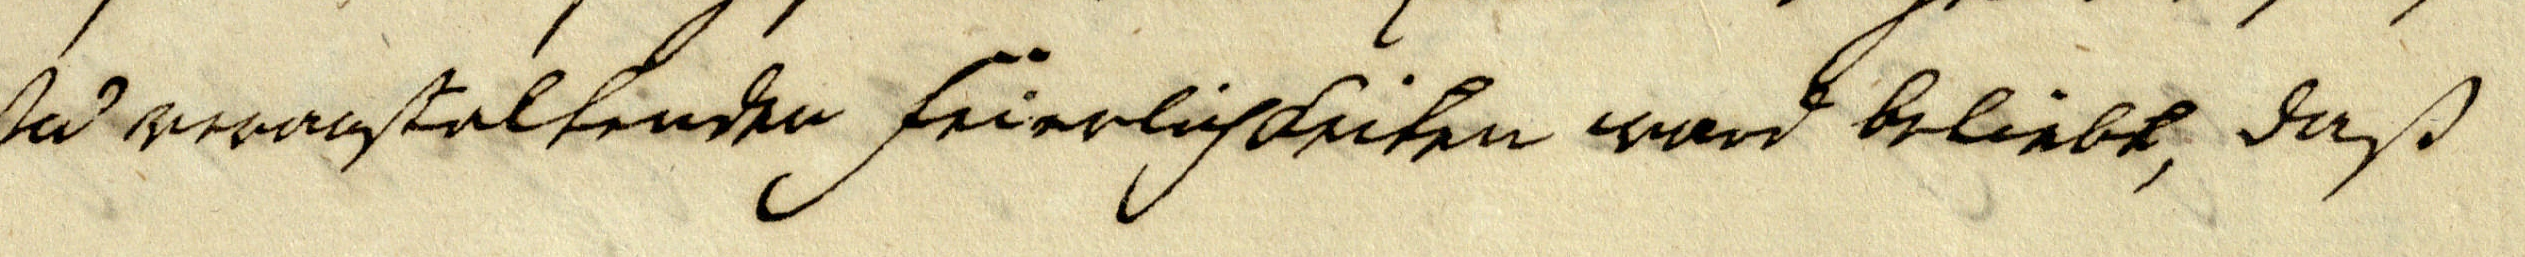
zu veranstaltenden Feierlichkeiten ward beliebt, daß
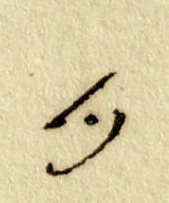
1.,
